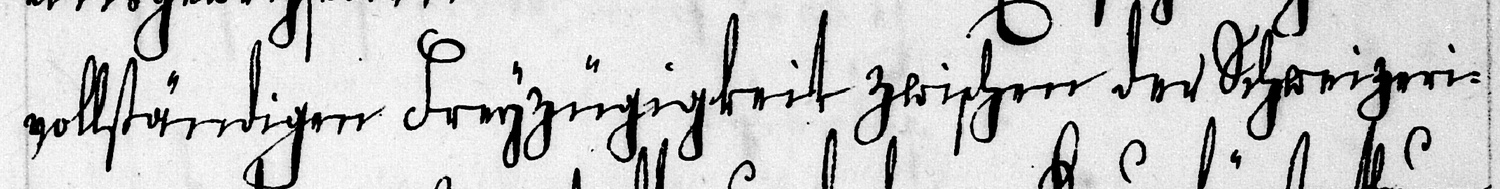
vollständigen Freyzügigkeit zwischen der Schweizeri¬
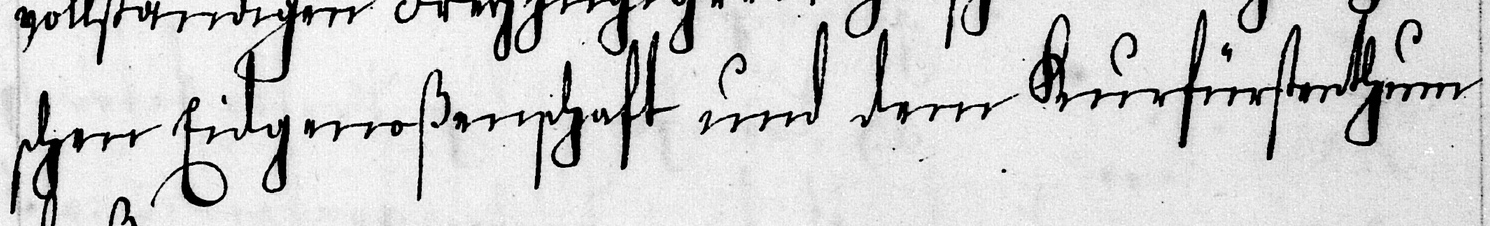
schen Eidgenoßenschaft und dem Kurfürstenthum
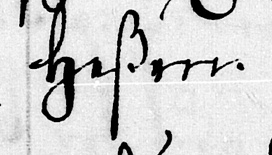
Heßen.
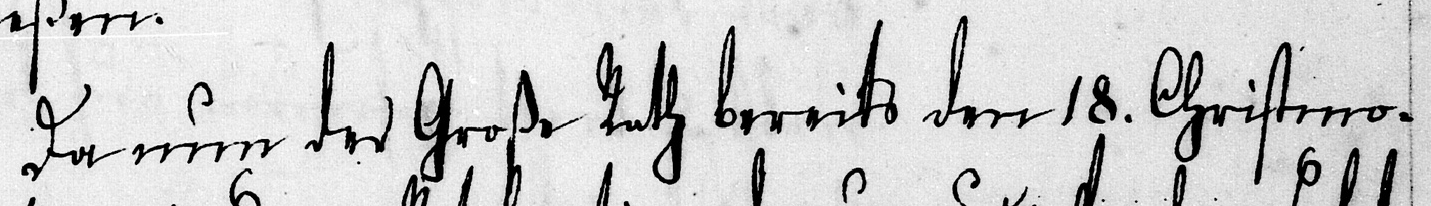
Da nun der Große Rath bereits den 18. Christmo¬
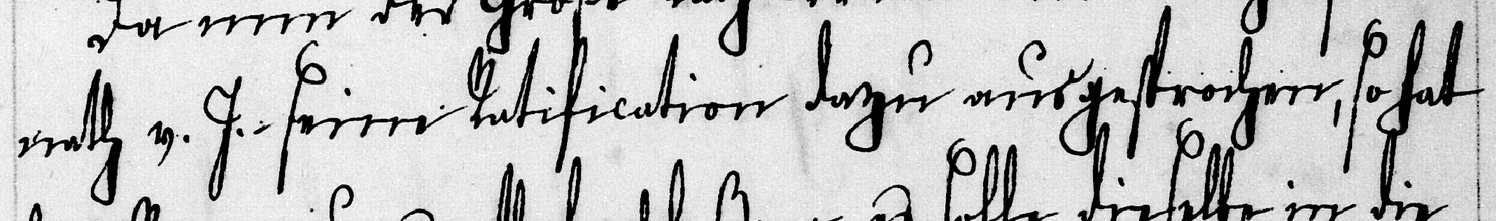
nath v. J. seine Ratification dazu ausgesprochen, so hat
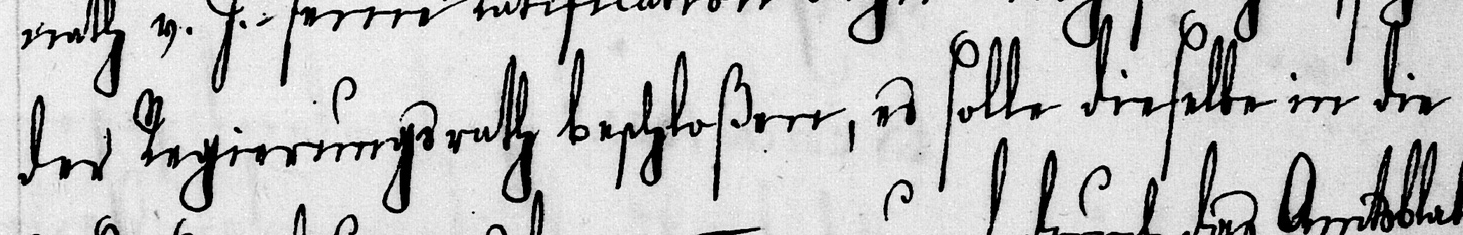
der Regierungsrath beschloßen, es solle dieselbe in die
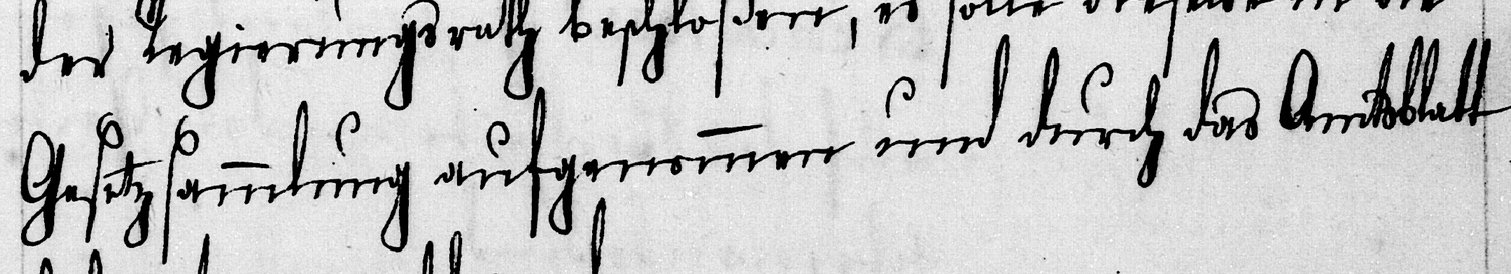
Gesetzsammlung aufgenommen und durch das Amtsblatt
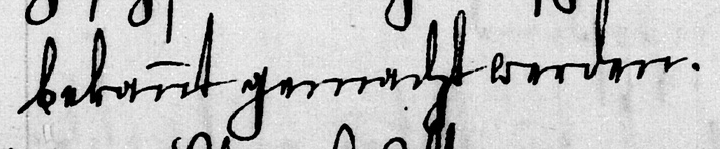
bekannt gemacht werden.
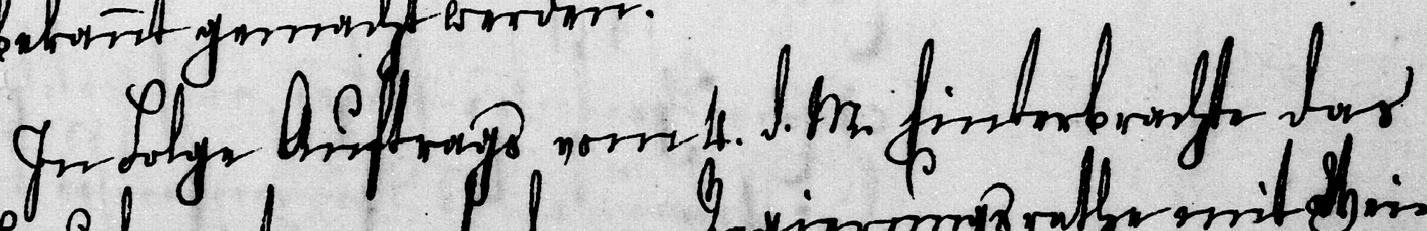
In Folge Auftrags vom 4. d. M. hinterbrachte das
